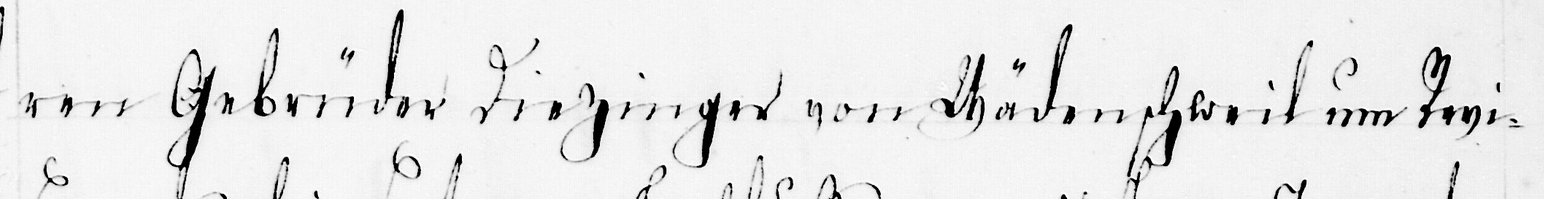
ren Gebrüder Diezinger von Wädenschweil um Revi¬
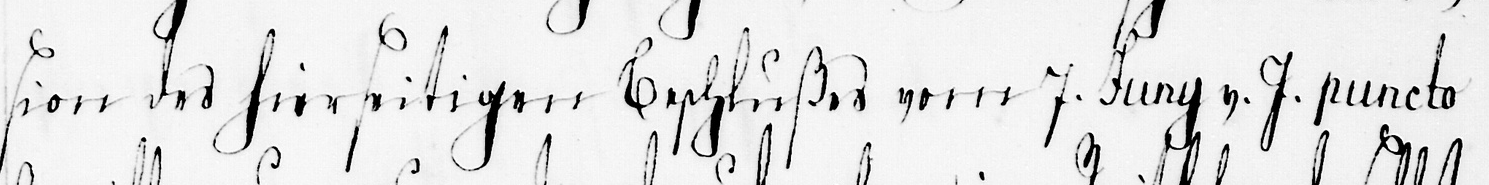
sion des hierseitigen Beschlußes vom 7. Juny v. J. puncto
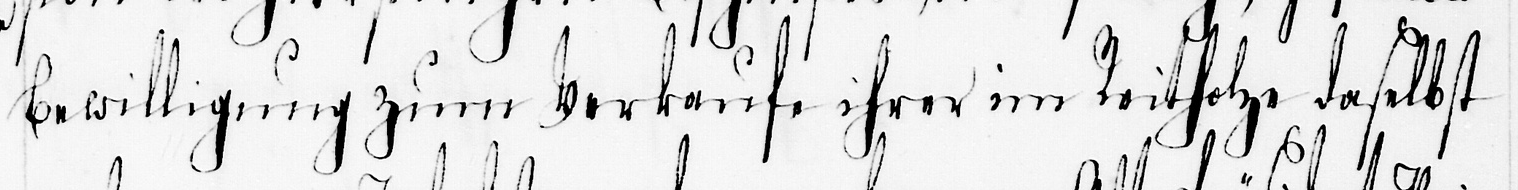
Bewilligung zum Verkaufe ihrer im Reitholze daselbst
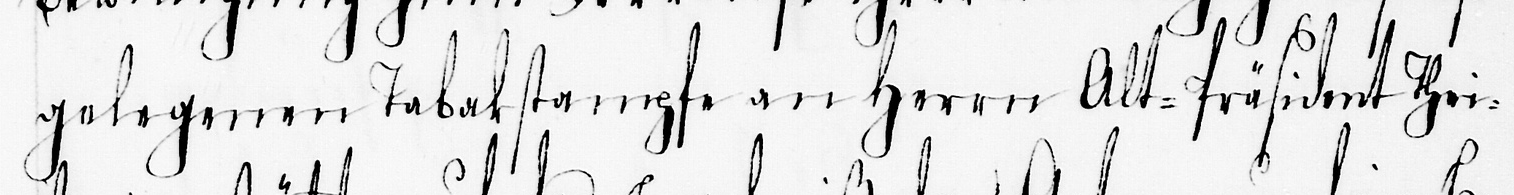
gelegenen Tabakstampfe an Herrn Alt-Präsident Thei¬
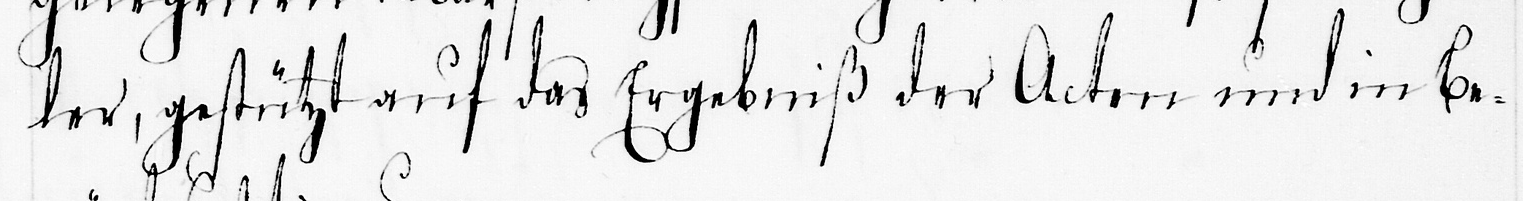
ler, gestützt auf das Ergebniß der Acten und in Be¬
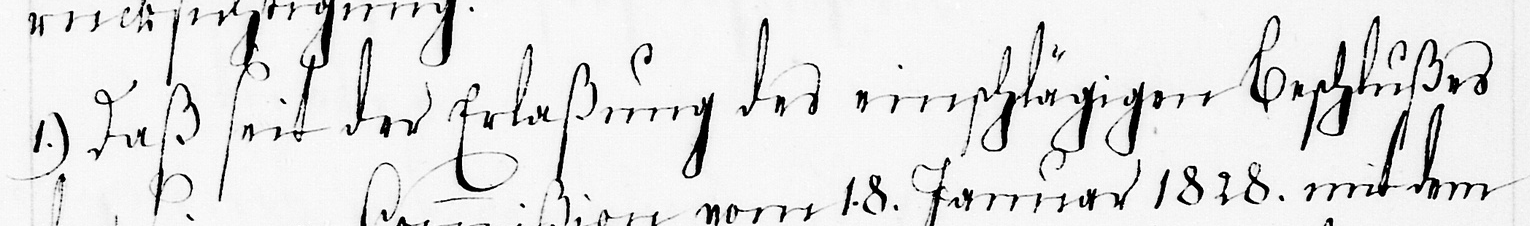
1.) Daß seit der Erlaßung des einschlägigen Beschlußes
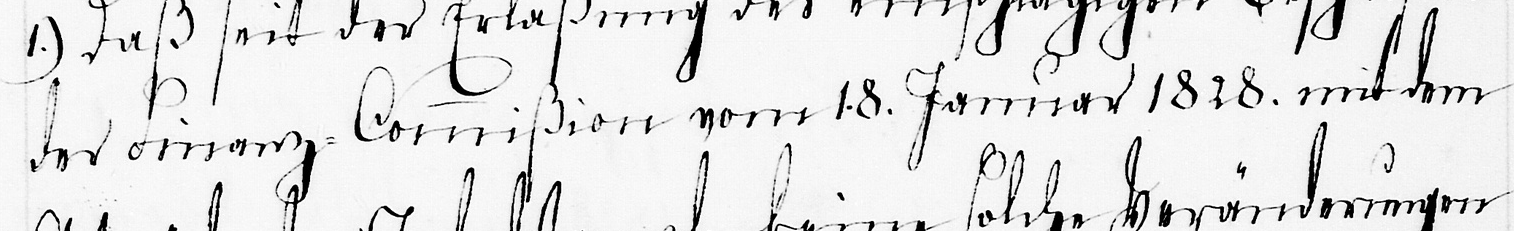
der Finanz-Commißion vom 18. Januar 1828. mit dem
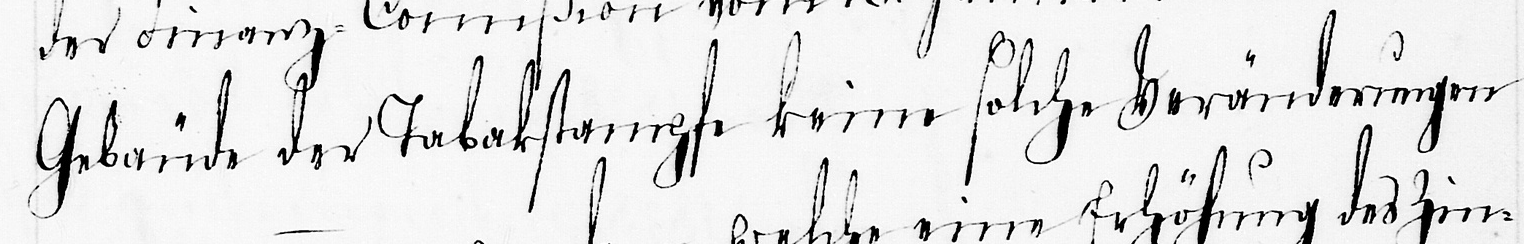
Gebäude der Tabakstampfe keine solche Veränderungen
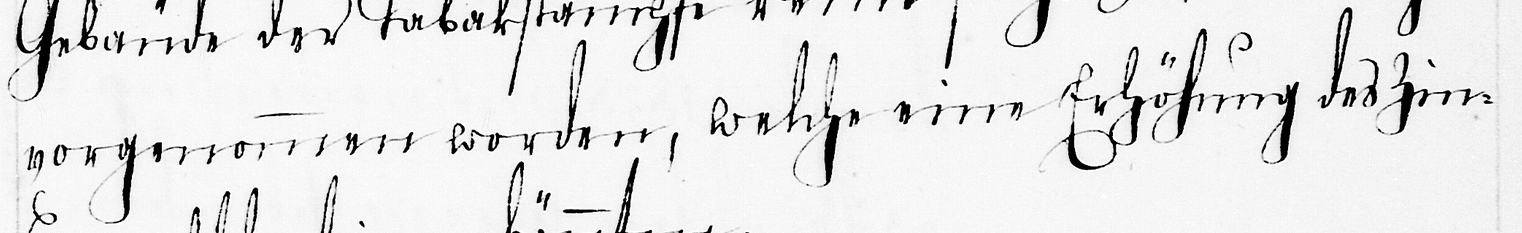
vorgenommen worden, welche eine Erhöhung des Zin¬
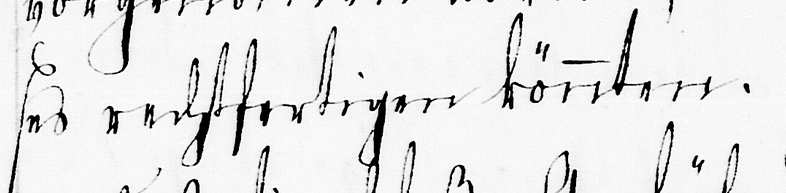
ses rechtfertigen könnten.
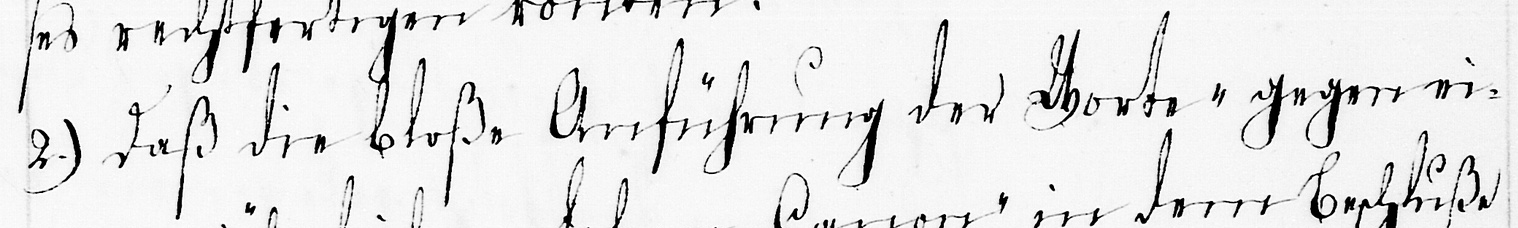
2.) Daß die bloße Anführung der Worte „gegen ei¬
